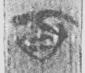百
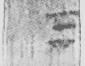三
